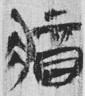𨟻（將）
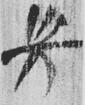𡵂（美）
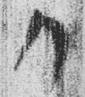人
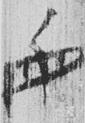母（毋）
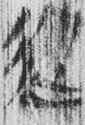○（過）
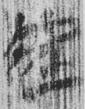○（吾）
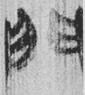門
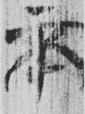不
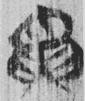瞚
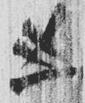之
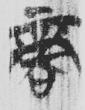商
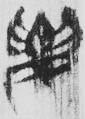○（要）
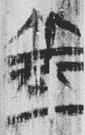丘
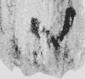又（有）
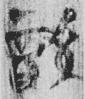○（絞）
